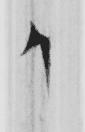人
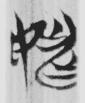姚
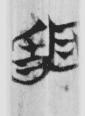䎽
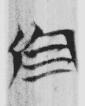於
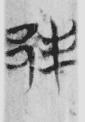邦=
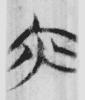亦
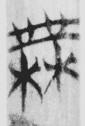無
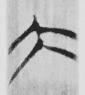大
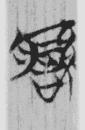䌛
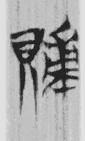{貝甫}
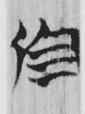於
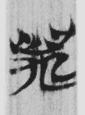萬
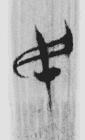民
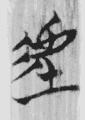𫊟
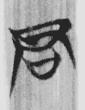君
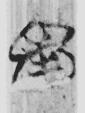函
